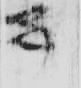邑
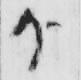人
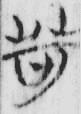苛
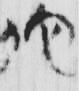佗
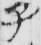子
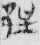郢
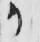人
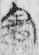酓（熊）
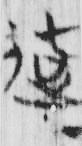适
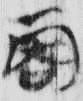丙
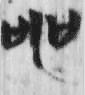申
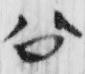公
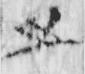之
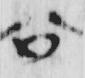公
